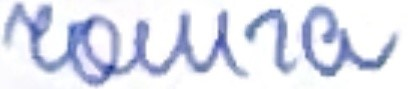чомга
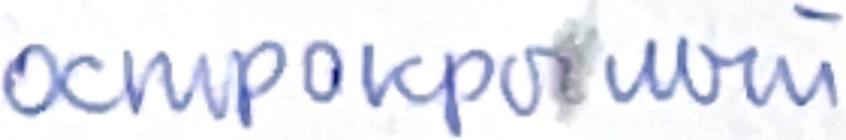острокрылый
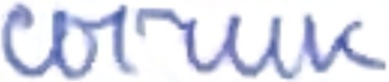сычик
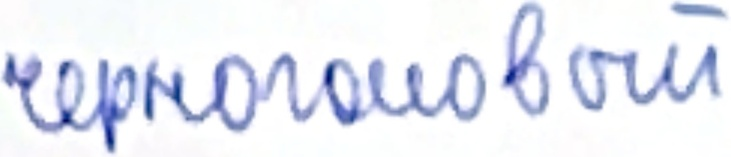черноголовый
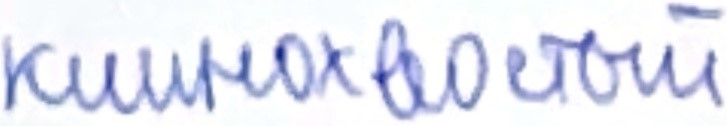клинохвостый
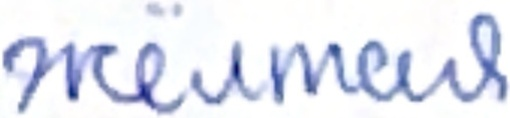жёлтая
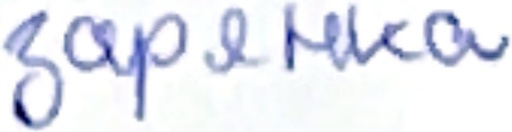зарянка
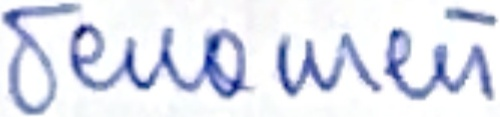белошей
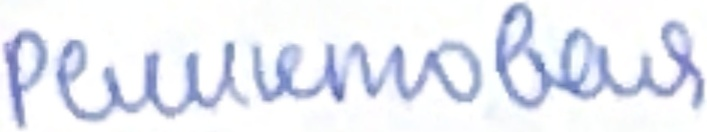реликтовая
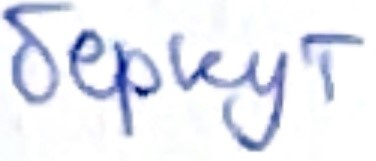беркут
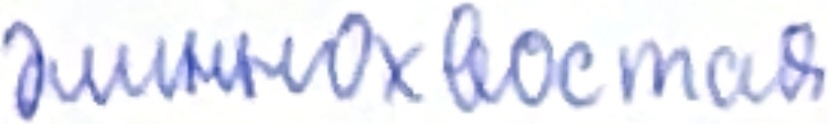длиннохвостая
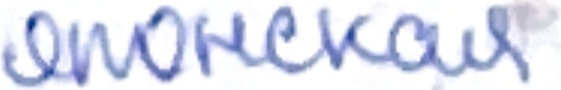японская
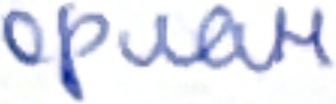орлан
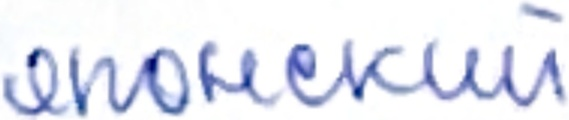японский
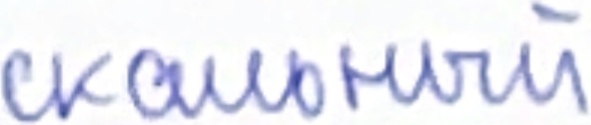скальный
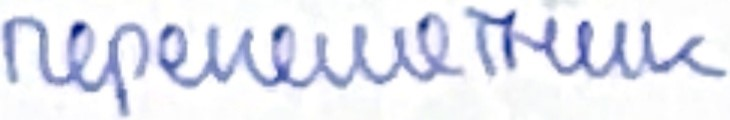перепелятник
